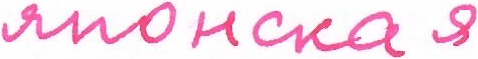японская
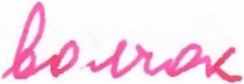волчок
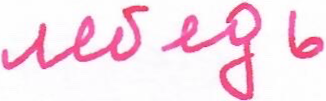лебедь
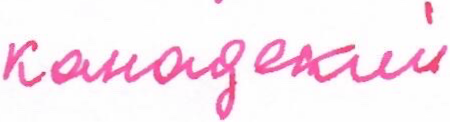канадский
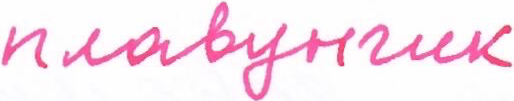плавунчик
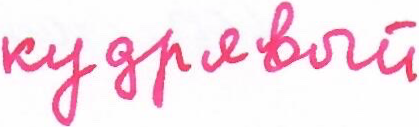кудрявый
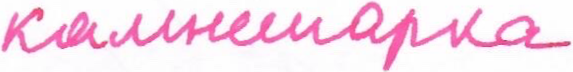камнешарка
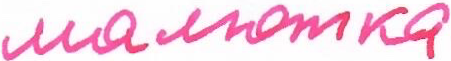малютка
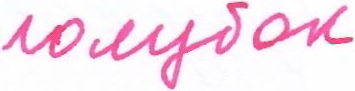голубок
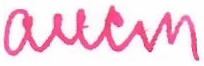аист
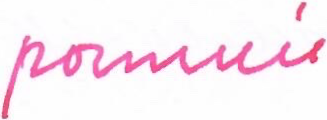рыжий
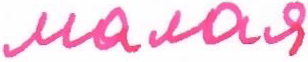малая
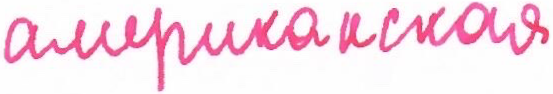американская
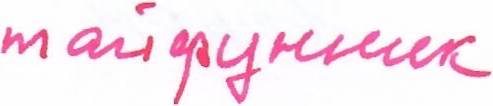тайфунник
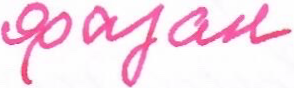фазан
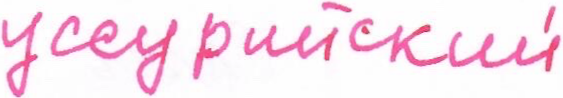уссурийский
